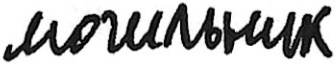могильник
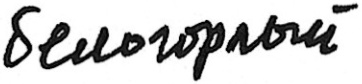белогорлый
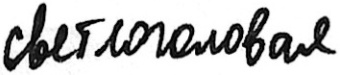светлоголовая
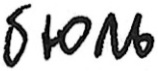бюль
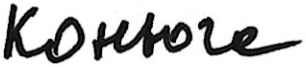конюга
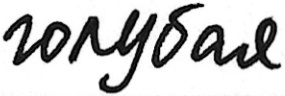голубая
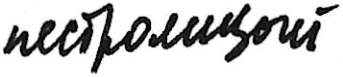пестролицый
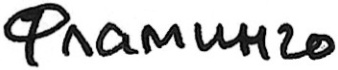фламинго
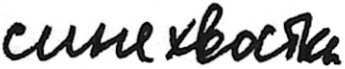синехвостка
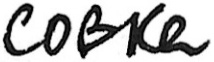совка
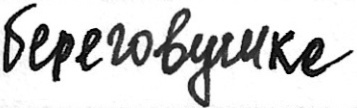береговушка
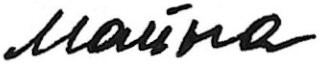майна
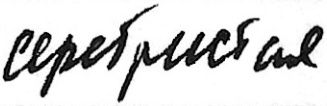серебристая
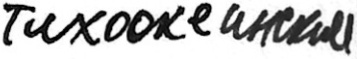тихоокеанскии
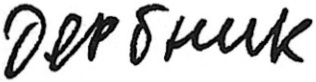дербник
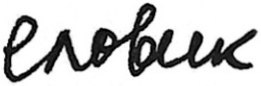еловик
